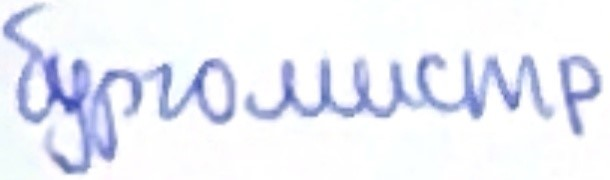бургомистр
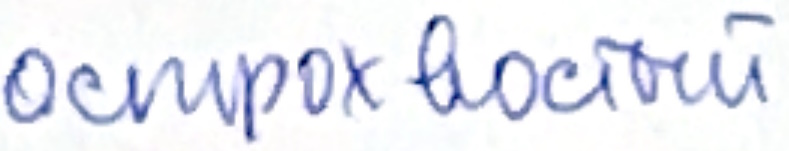острохвостый
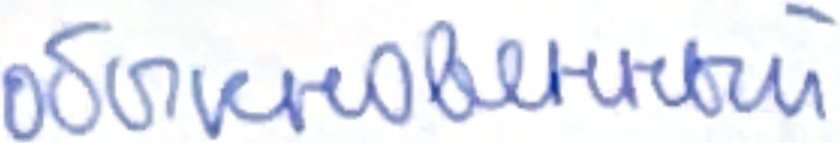обыкновенный
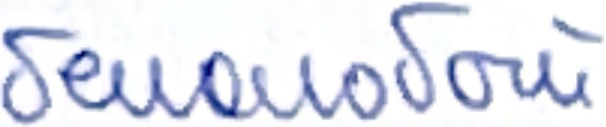белолобый
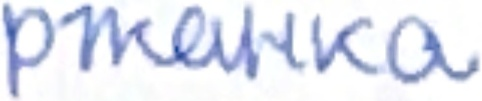ржанка
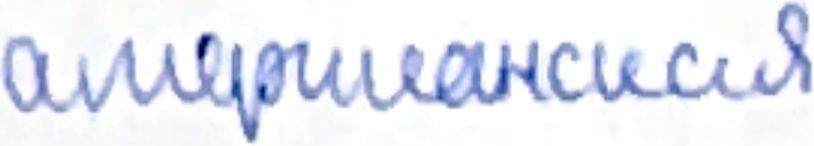американская
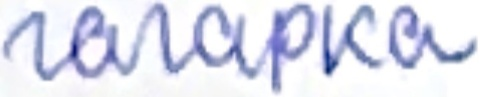гагарка
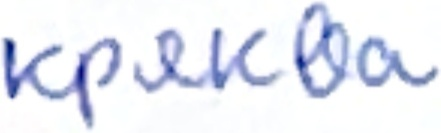кряква
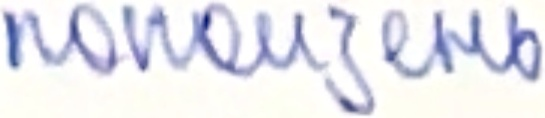поползень
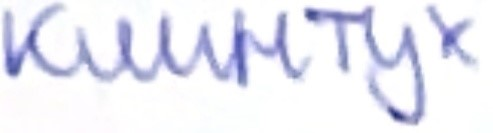клинтух
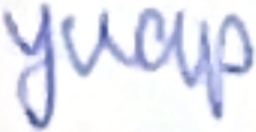улар
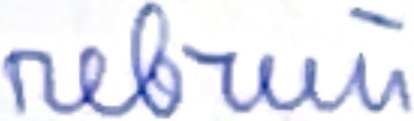певчий
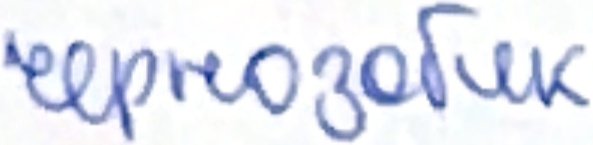чернозобик
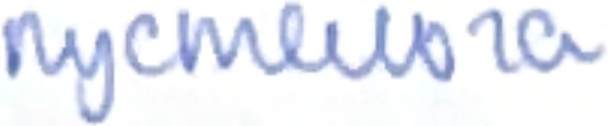пустельга
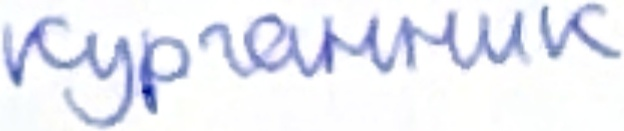курганник
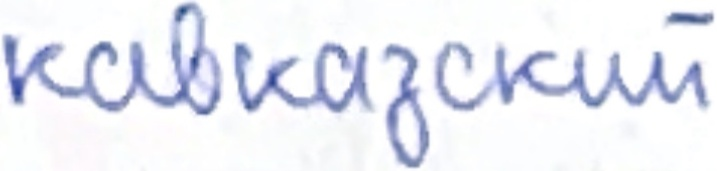кавказский
